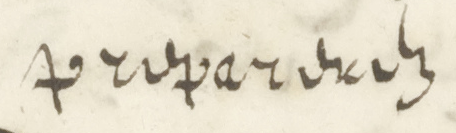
prepareren.
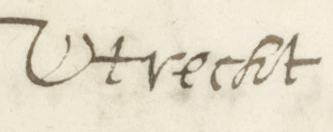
Utrecht
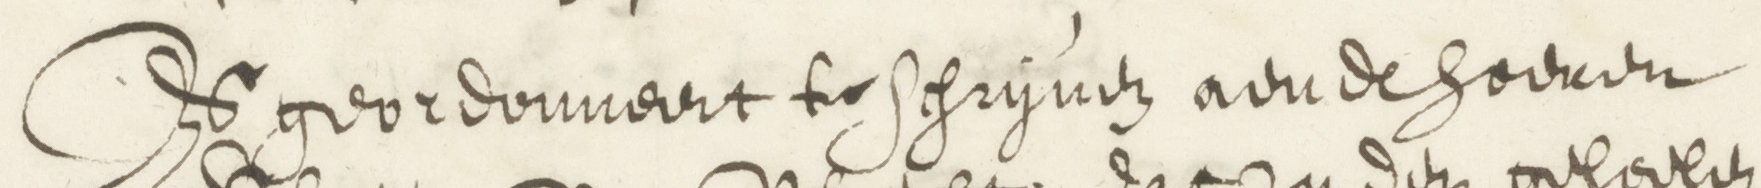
Is geordonneert te schrijuen aende heeren
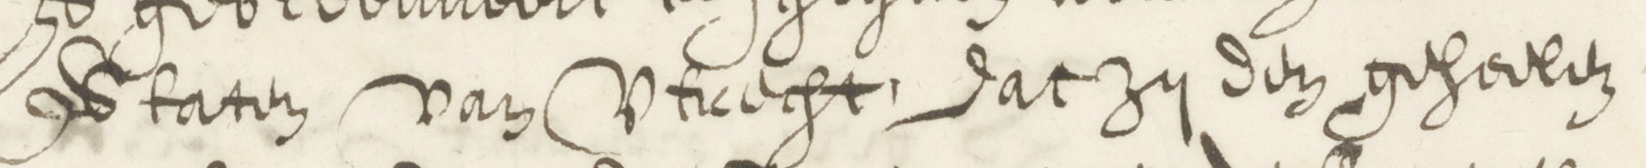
Staten van Utrecht, dat zy den geheelen
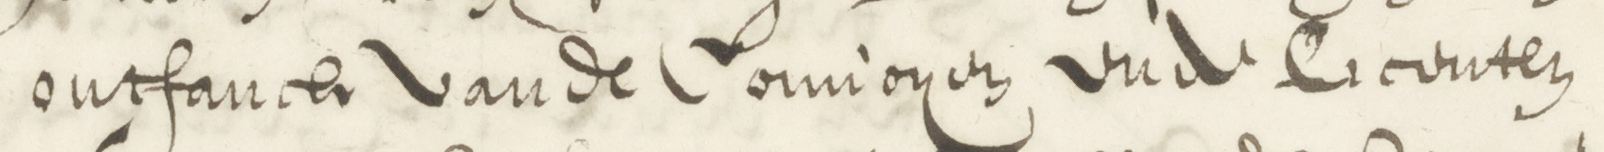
ontfanck vande Conuoyen ende Licenten
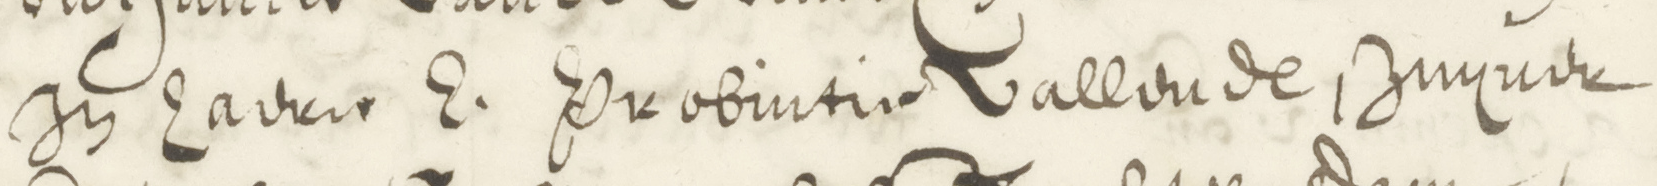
In haere E. Provintie vallende zuyuer
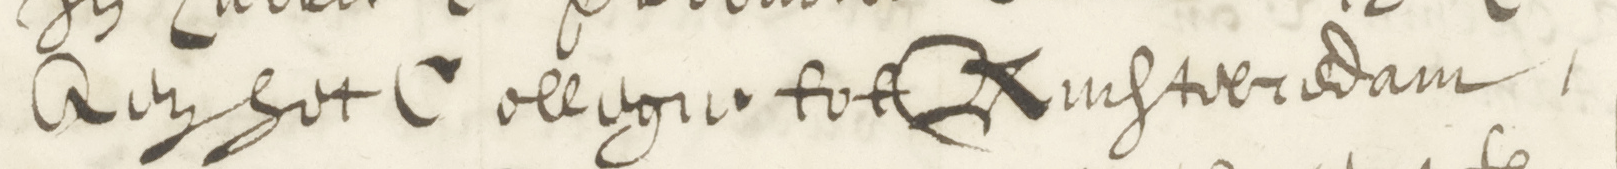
aen het Collegie tot Amstelredam,
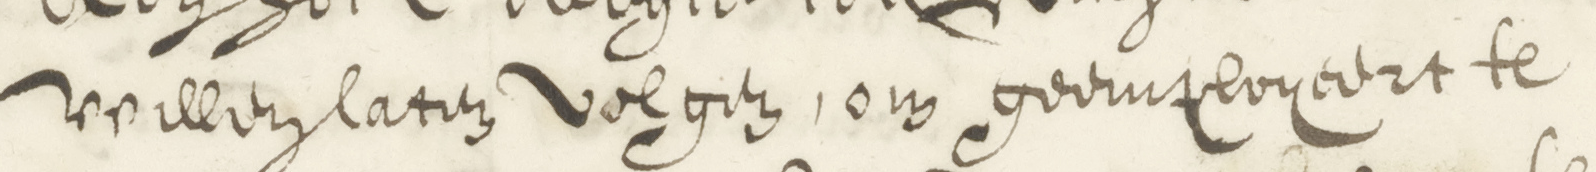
willen laten volgen, om geemployeert te
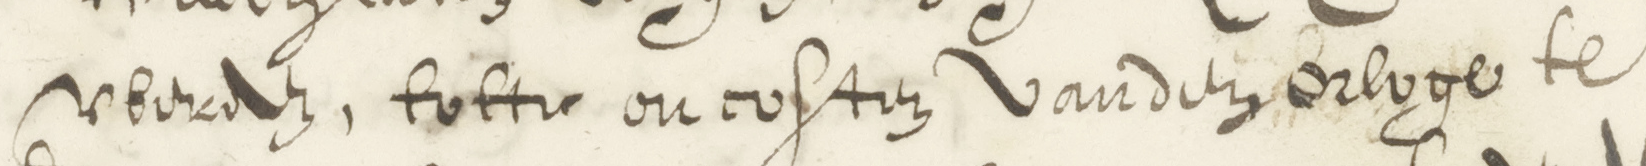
werden, totte oncosten vanden Orloge te
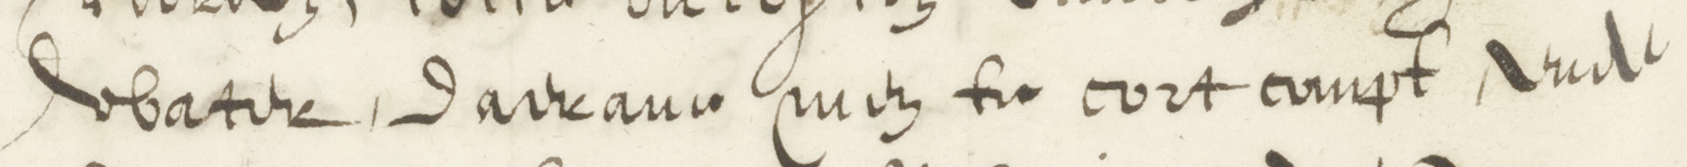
water, daerane men te cort compt, ende
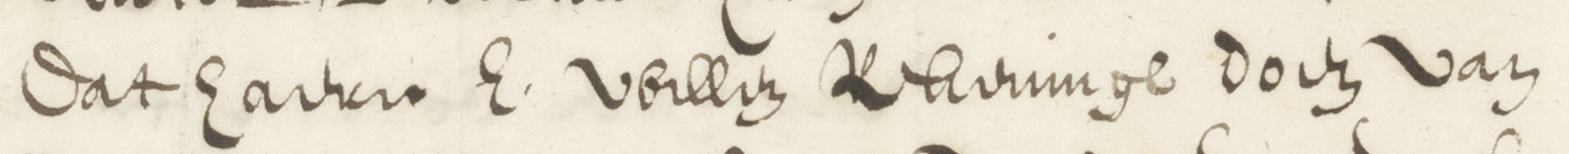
dat haere E. willen Rekeninge doen van
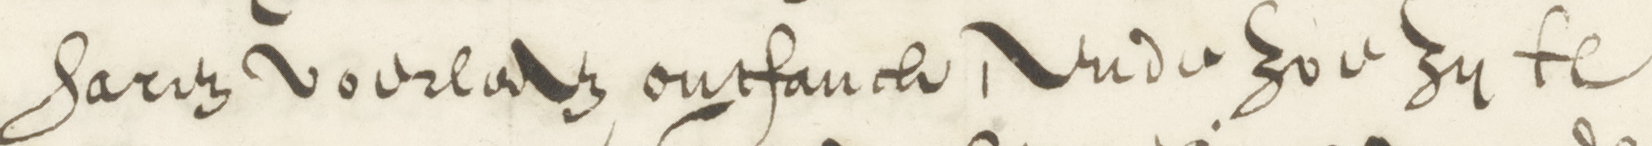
haren voerleden ontfanck, ende zoe zy te
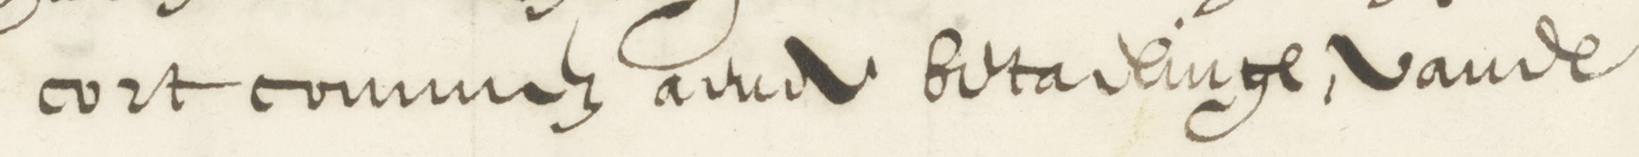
cort commen aende betaelinge, vande
